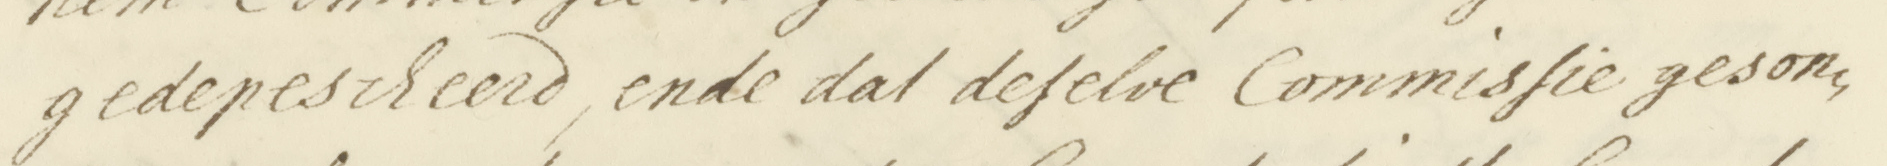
gedepescheerd, ende dat deselve commissie geson„
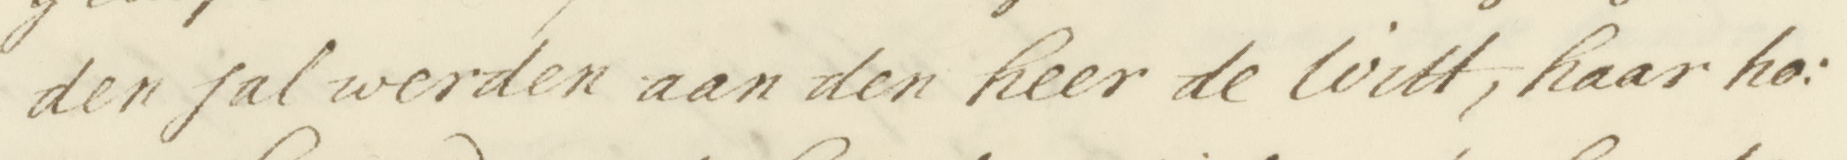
den sal werden aan den heer de Witt, haar ho:
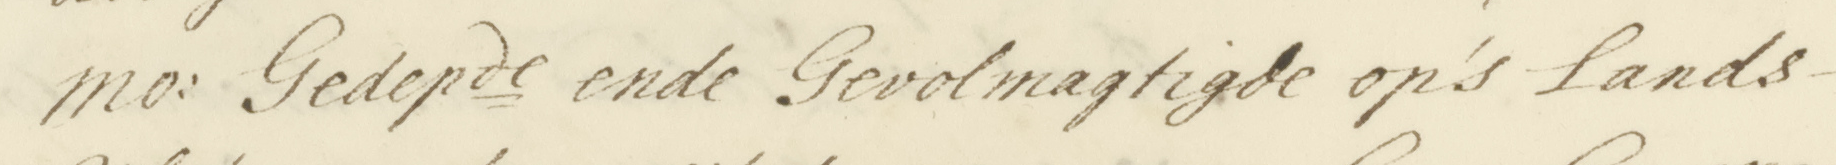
mo: Gedepde ende Gevolmagtigde op's Lands
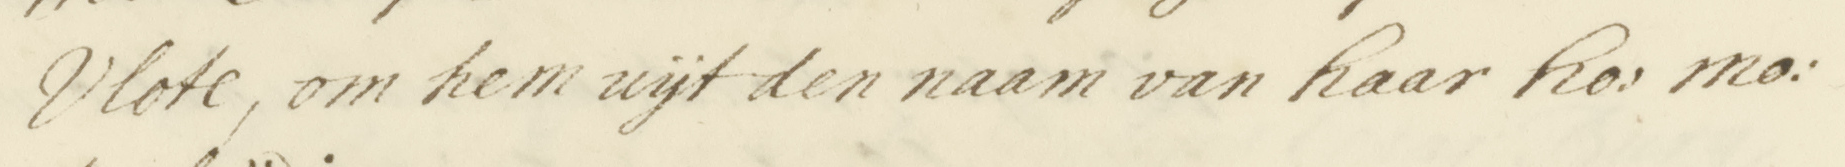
Vlote, om hem uijt den naam van haar ho:mo:
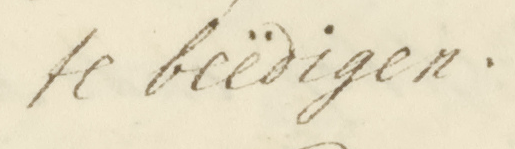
te beëdigen.
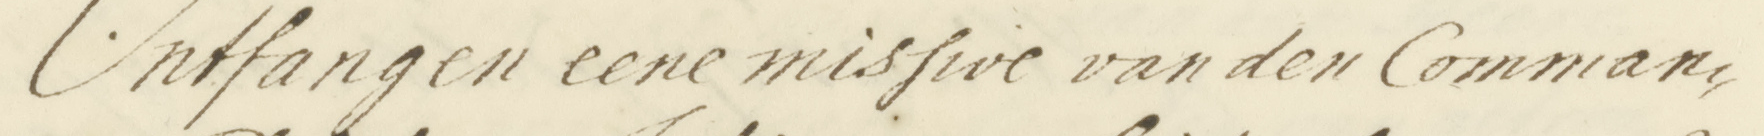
Ontfangen eene missive van den Comman„
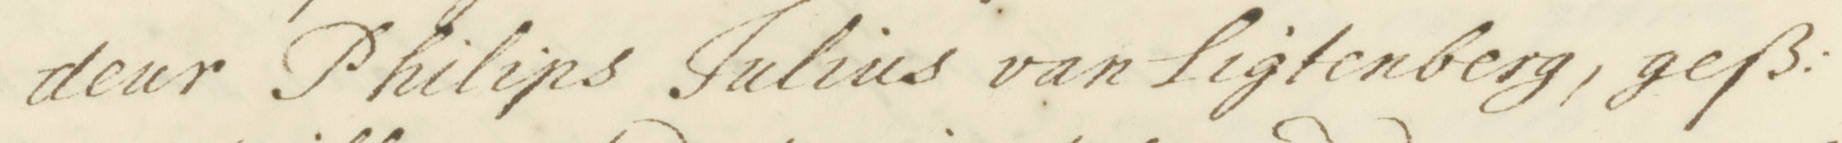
deur Philips Julius van Ligtenberg, ges:
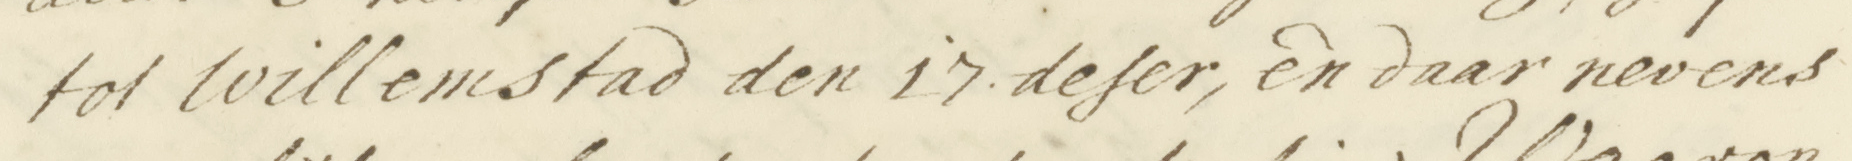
tot Willemstad den 17. deser, en daar nevens
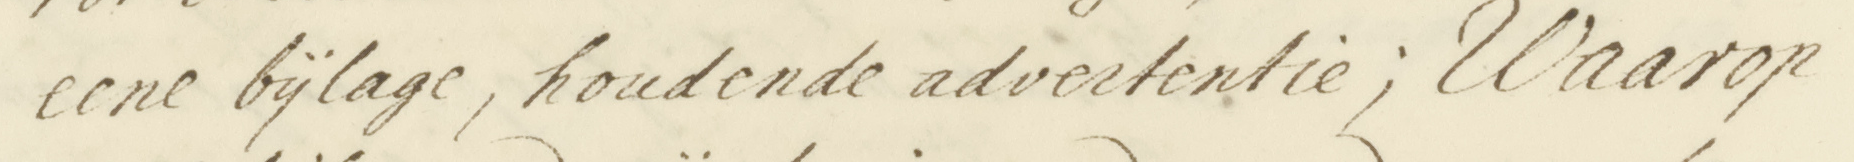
eene bijlage, houdende advertentie; Waarop
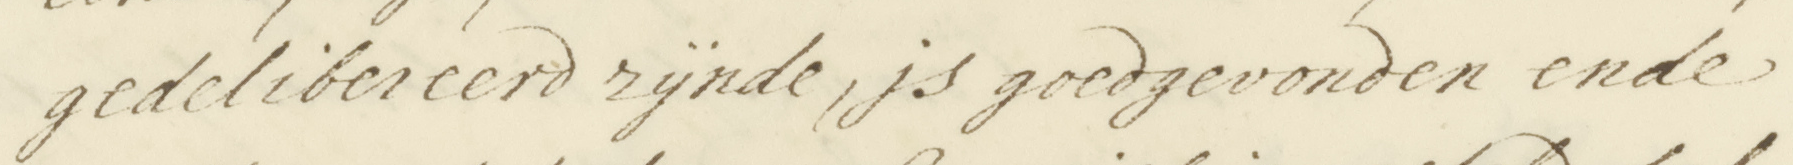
gedelibereerd zijnde, is goedgevonden ende
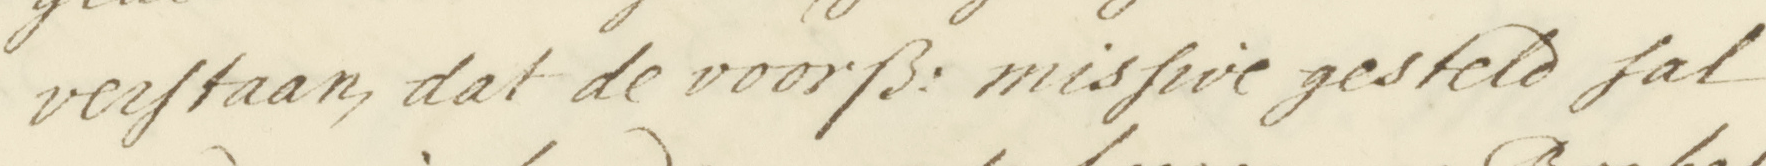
verstaan, dat de voors: missive gesteld sal
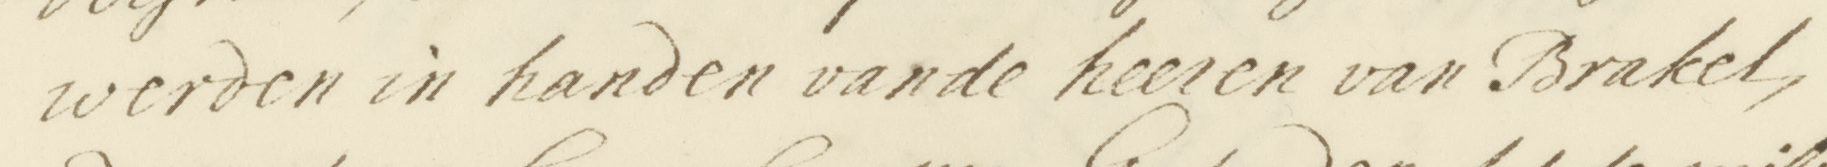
werden in handen van de heeren van Brakel,
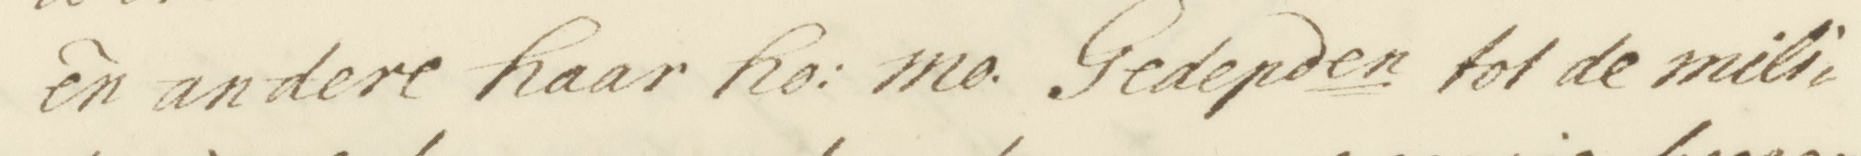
en andere haar ho:mo: Gedepden tot de mili,,
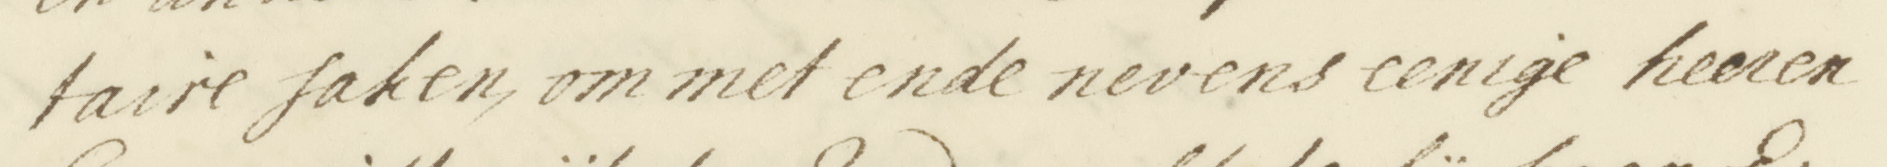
taire saken, om met ende nevens eenige heeren
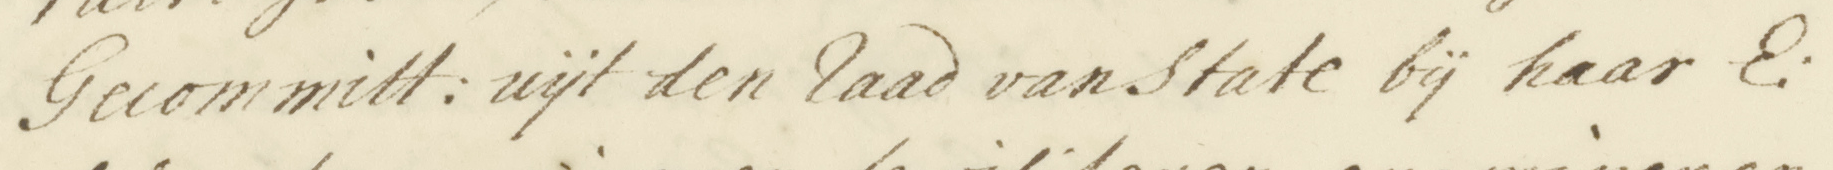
Gecommitt: uijt den Raad van State bij haar E.
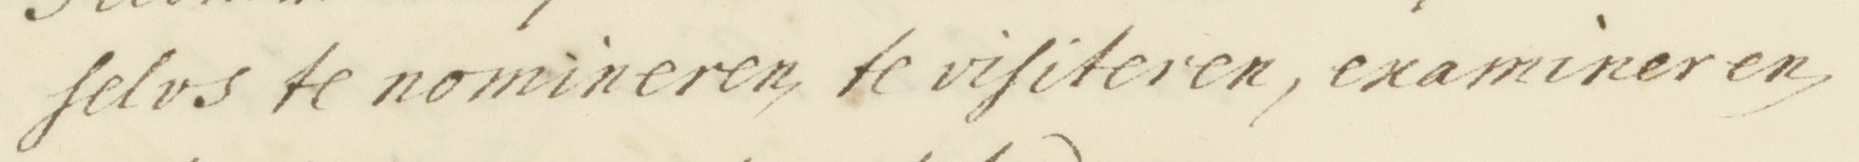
selve te nomineren, te visiteren, examineren,
